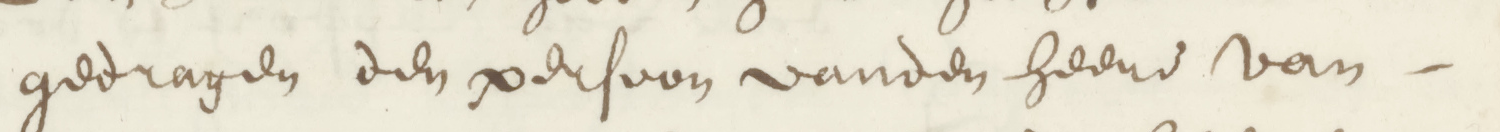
gedragen den persoon vanden heere van —
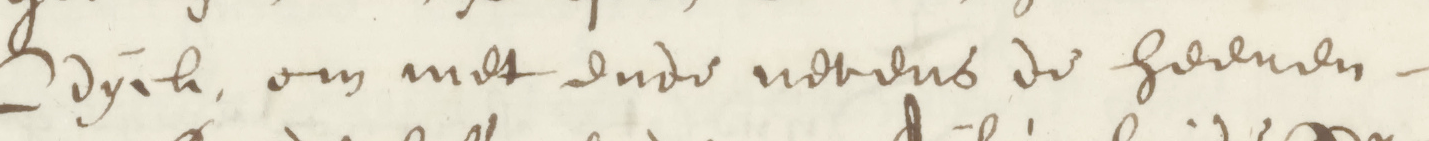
Odijck, om met ende nevens de heeren —
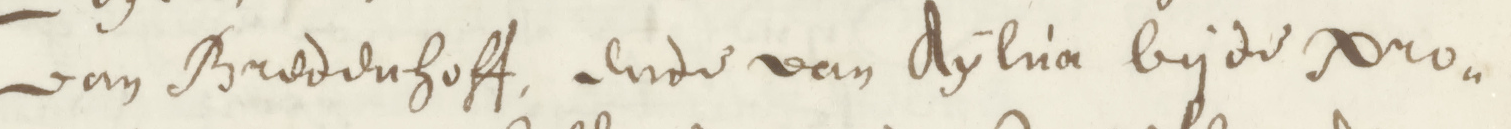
van Brederhoff, ende van Aijlua bijde Pro„
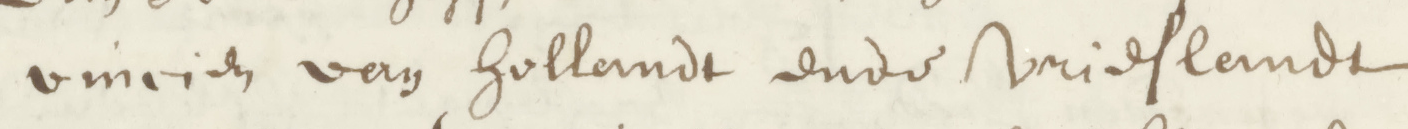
vincien van hollandt ende Vrieslandt
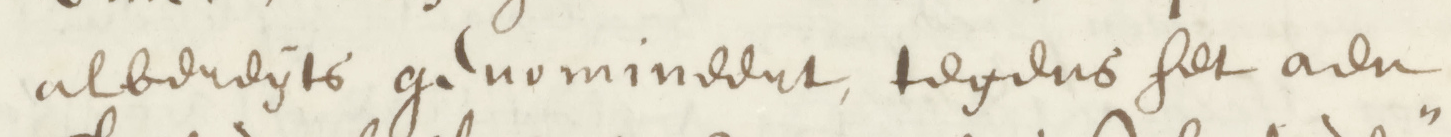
albereijts genomineert, tegens het aen„
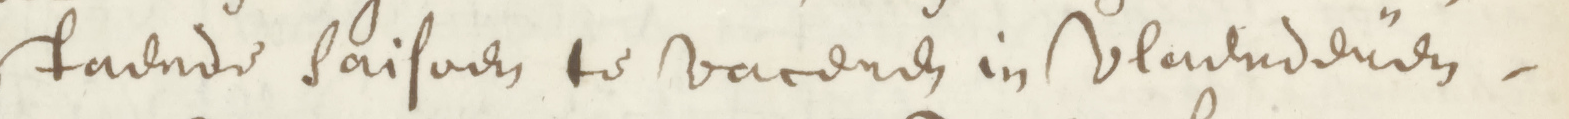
staende saisoen te vaceren in Vlaenderen —
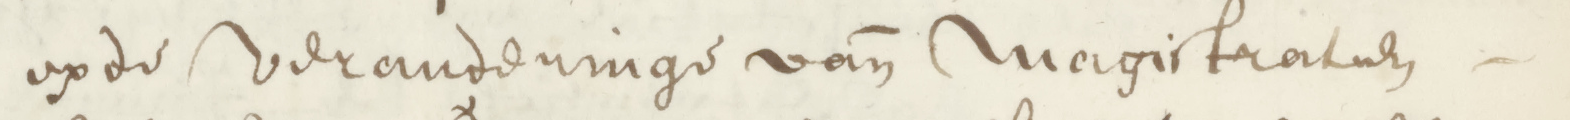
opde veranderinge van Magistraten —
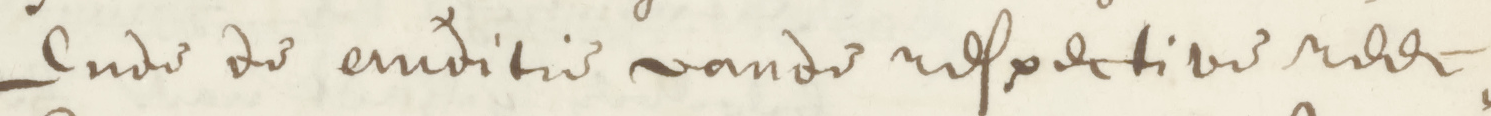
Ende de auditie vande respective reec„
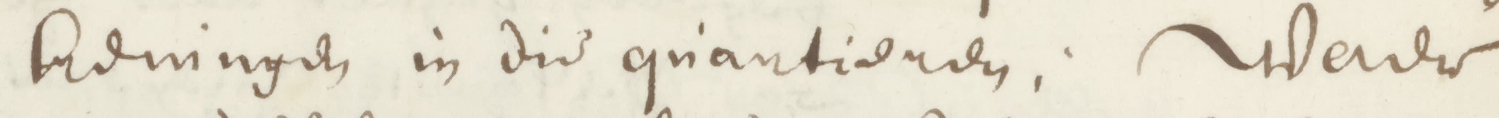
keningen in die quartieren: Waer
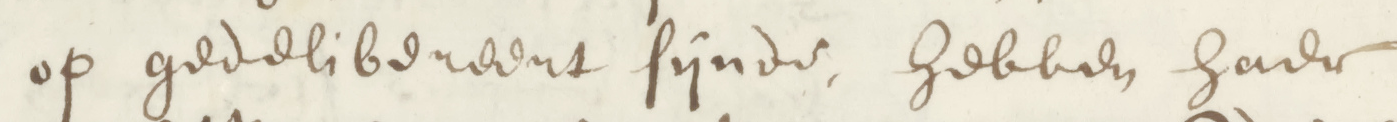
op gedelibereert sijnde, hebben haer
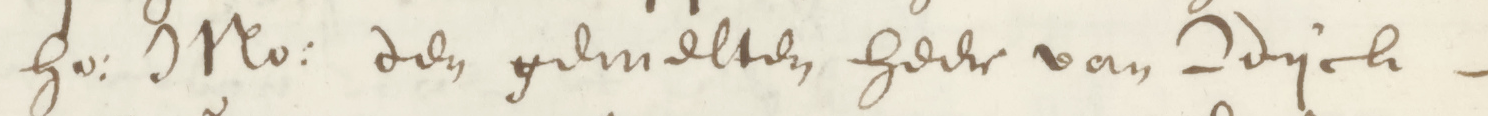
ho:Mo: den gemelten heer van Odijck —
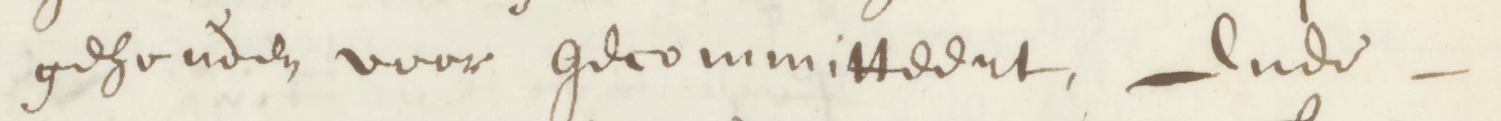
gehouden voor gecommitteert. Ende —
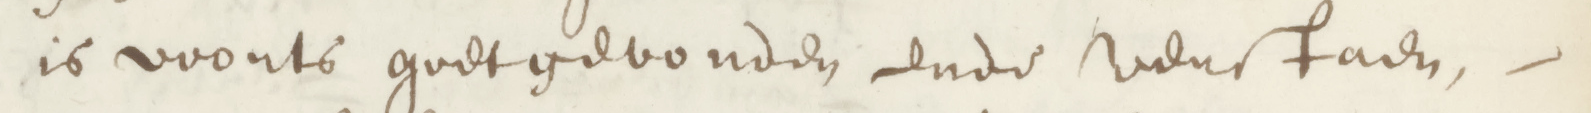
is voorts goetgevonden ende verstaen, —
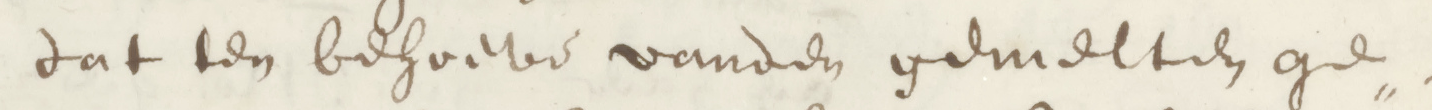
dat ten behoeve vanden gemelten ge„
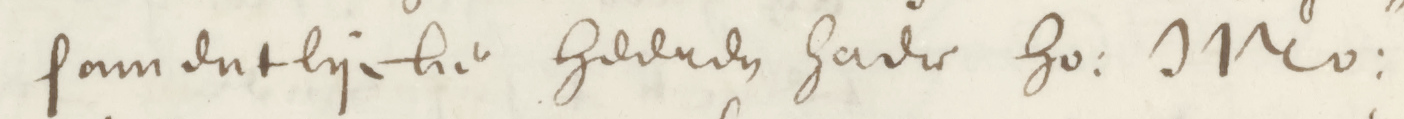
samentlijcke heeren haer ho:Mo:
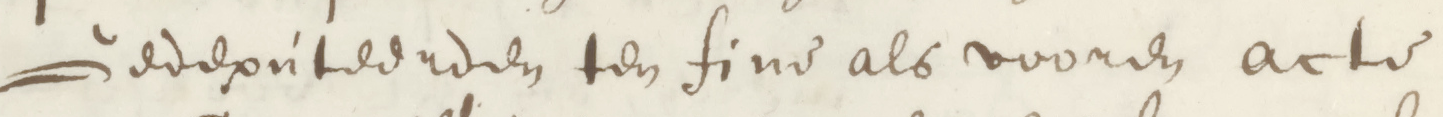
Gedeputeerden ten fine als vooren acte
